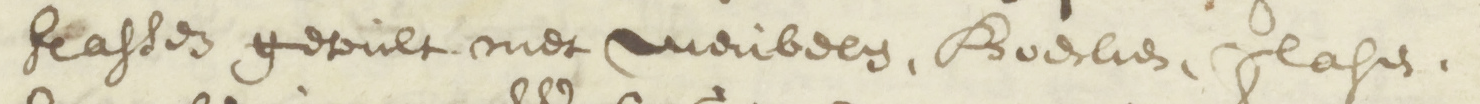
kassen gevult met Meubelen, Boecken, Glasen,
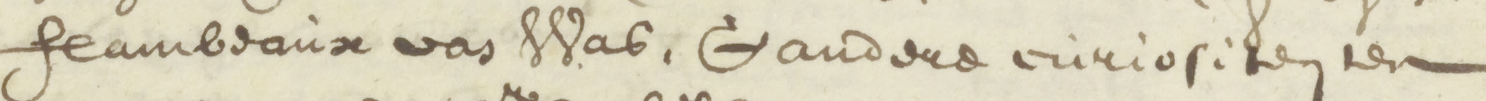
flambeaux van Was, & andere curiositeyten
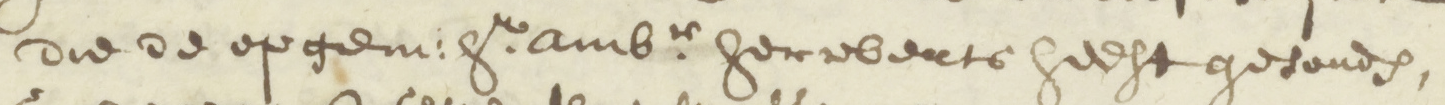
die de opgem: hr. ambr. herwerts heeft gesonden,
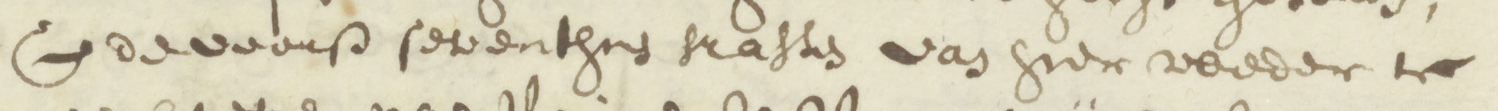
& de voorsz seventhien kassen van hier weder te
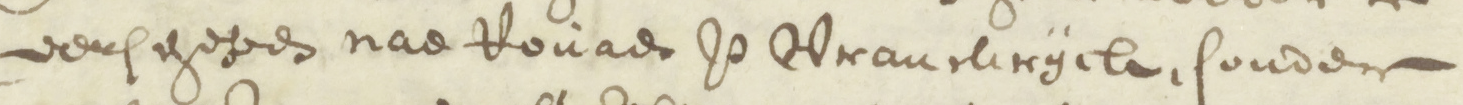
verschepen nae Rouaen in Vranckrijck, souden
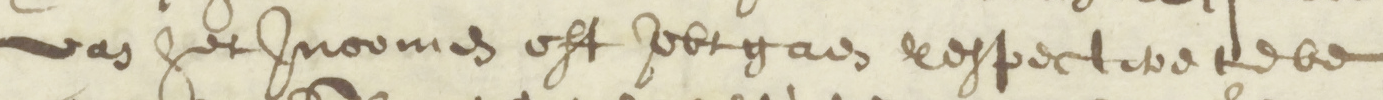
van het incomen oft wtgaen respective twee
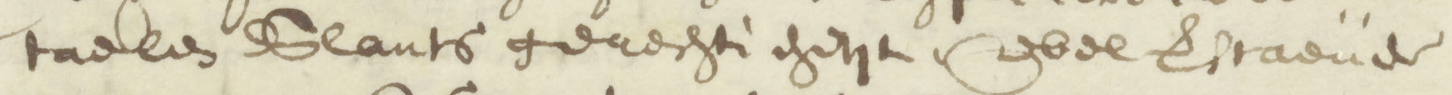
taelen Slants gerechticheyt wel vstaende
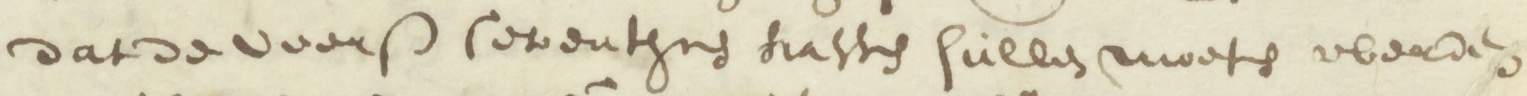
dat de voors seventhien kasten sullen moeten werden
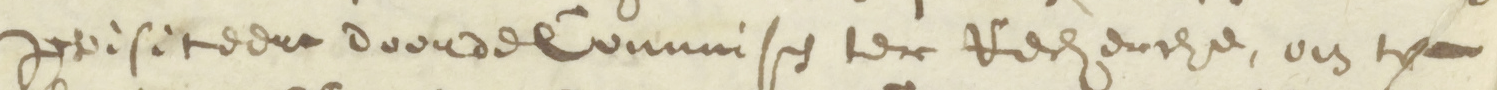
gevisiteert doorde Commiss ter Recherche, om te
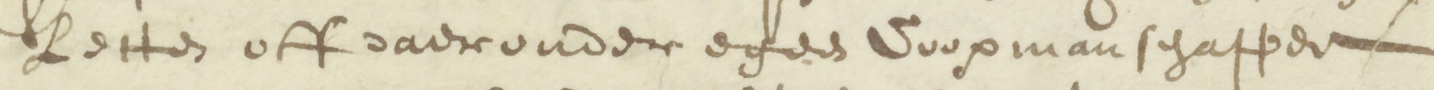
Letten off daeronder egeen Coopmanschappen
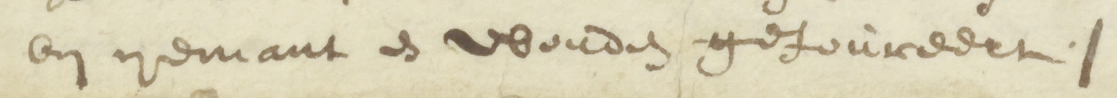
bij yemant en worden gefoureert./
